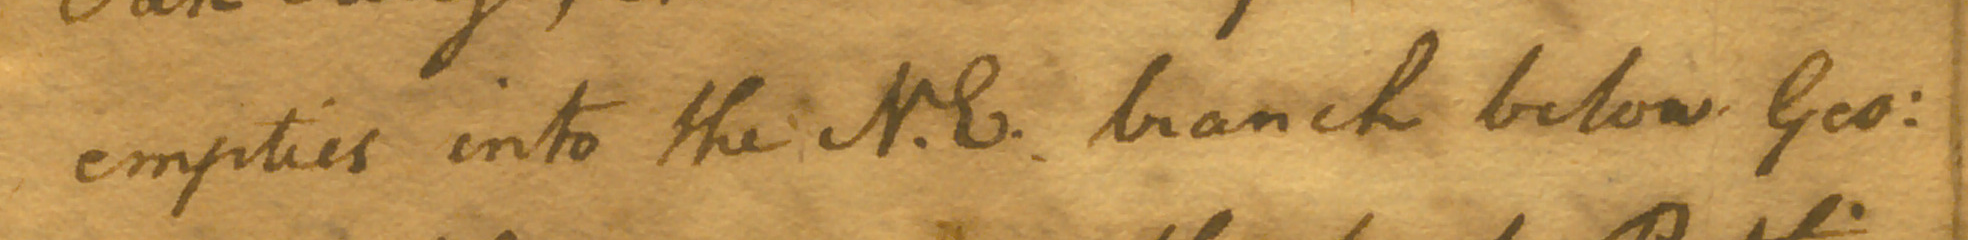empties into the N.E. branch below Geo:
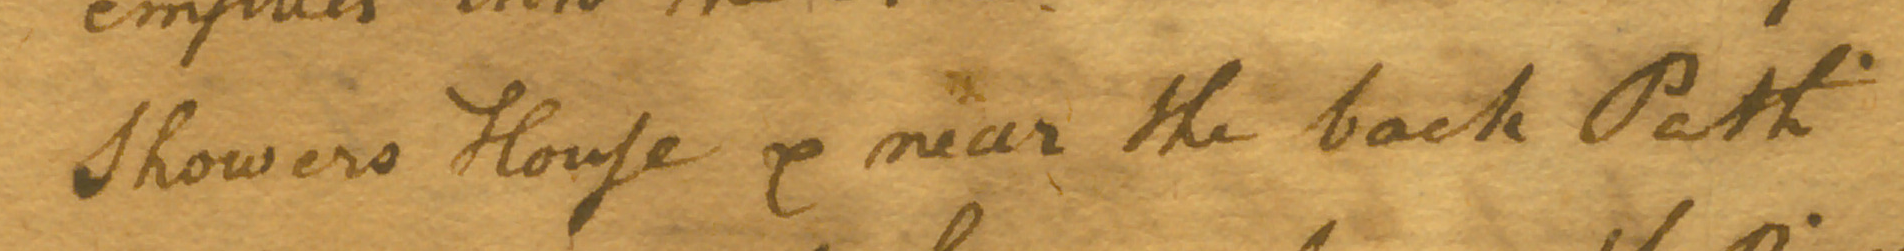Showers House & near the back Path
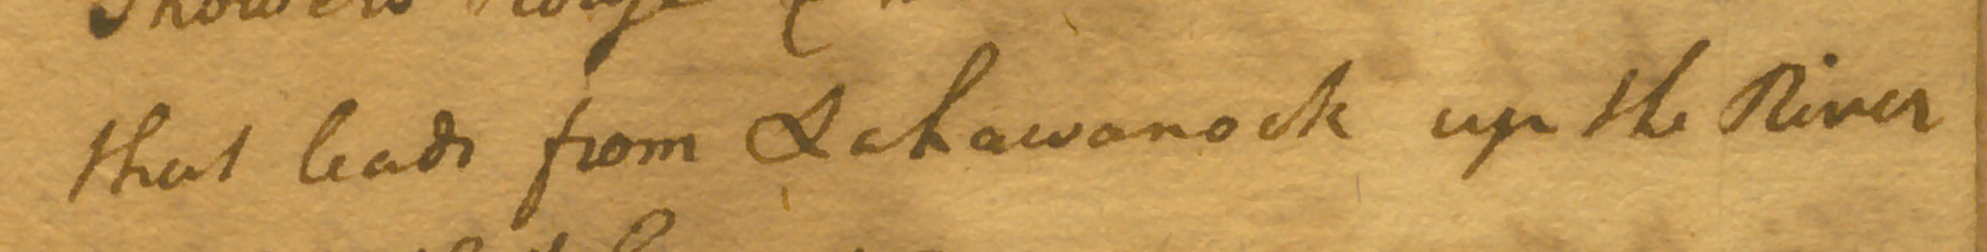that leads from Sahawanock up the River
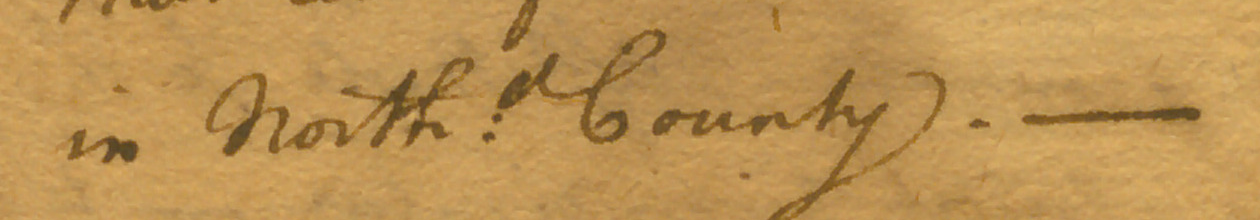in North^d: County.-
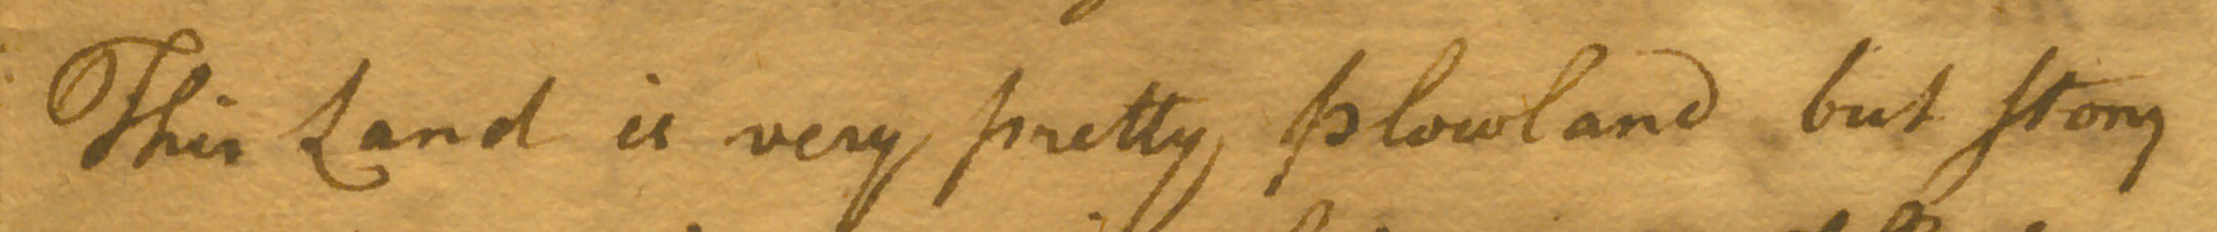This Land is very pretty plowland but stony
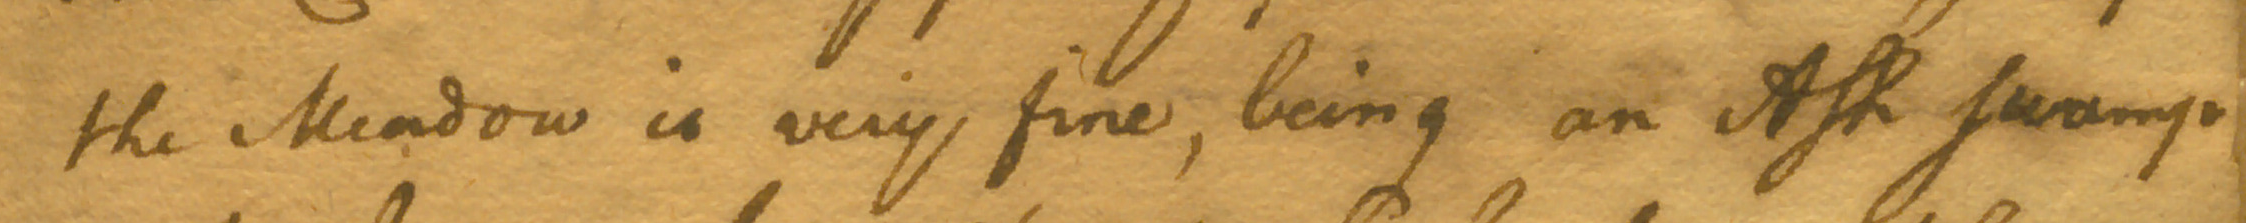the Meadow is very fine, being an Ash swamp
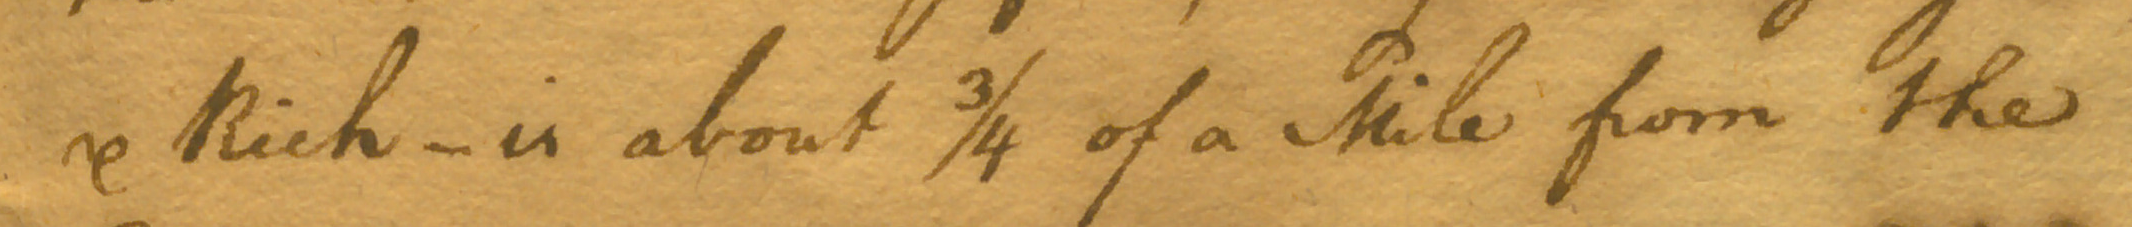& Rich- is about 3/4 of a Mile from the
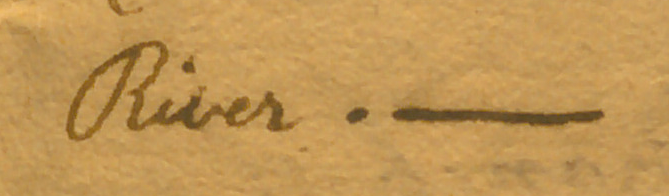River.-
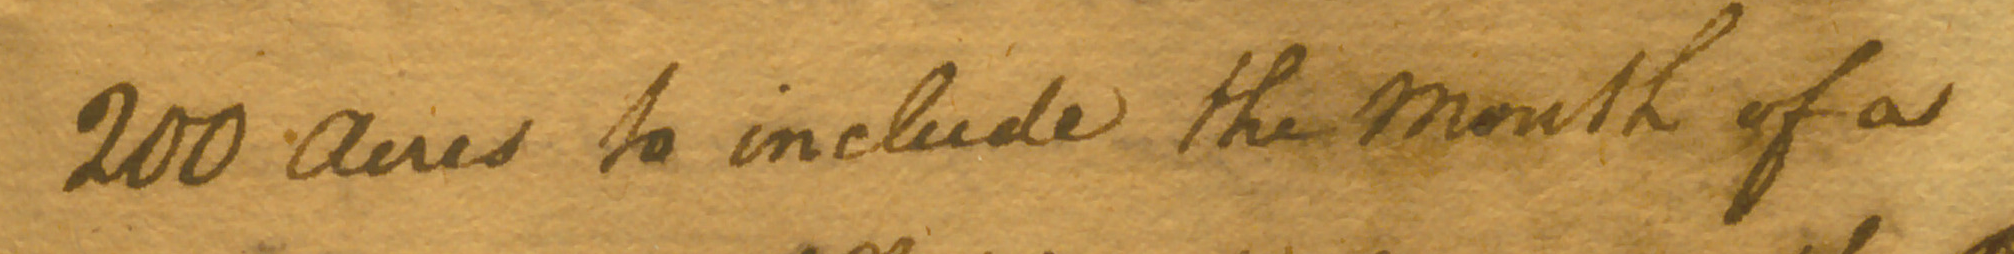200 acres to include the mouth of a
